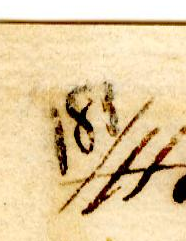181
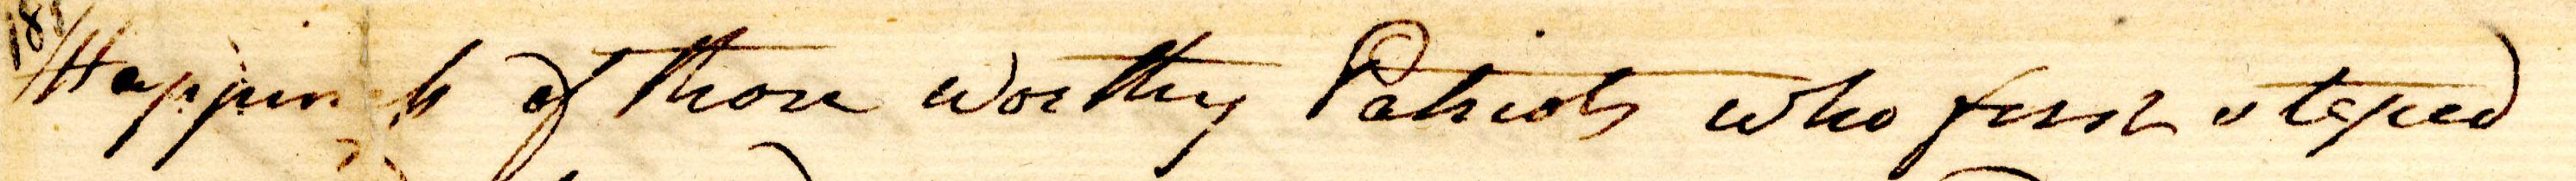Happiness of those worthy Patriots who first steped
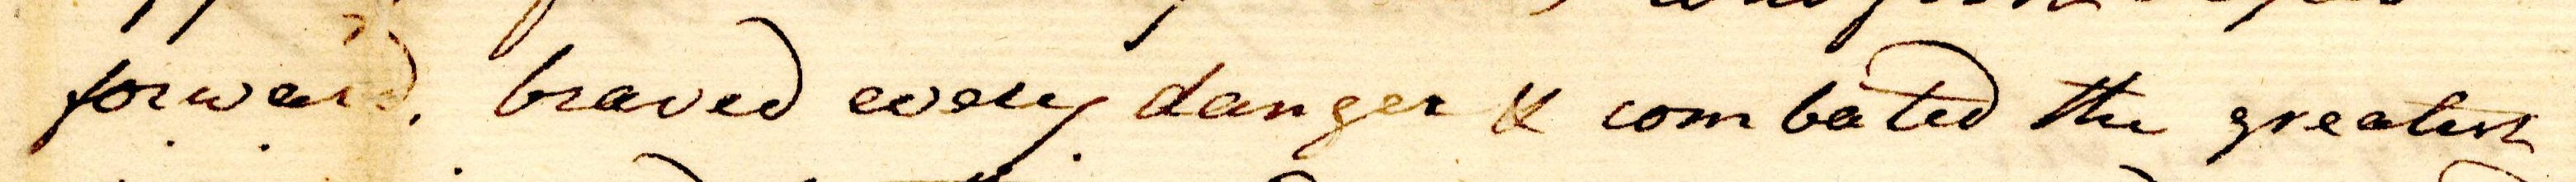forward, braved every danger & combated the greatest
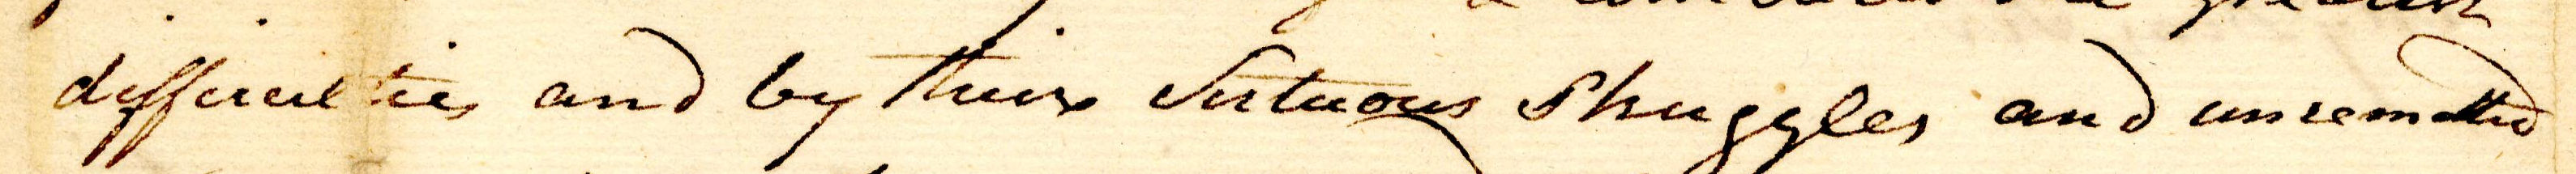difficulty and by their Fatuous Struggles and unsemetted
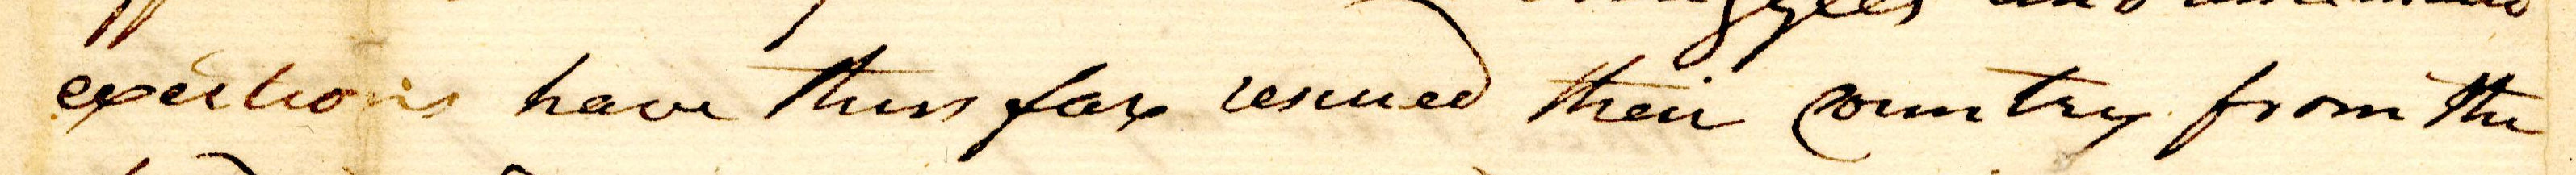executions have thus far rescued their country from the
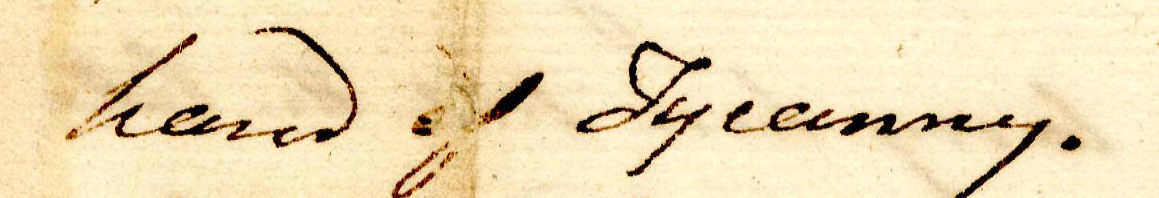hand of Tyranny.
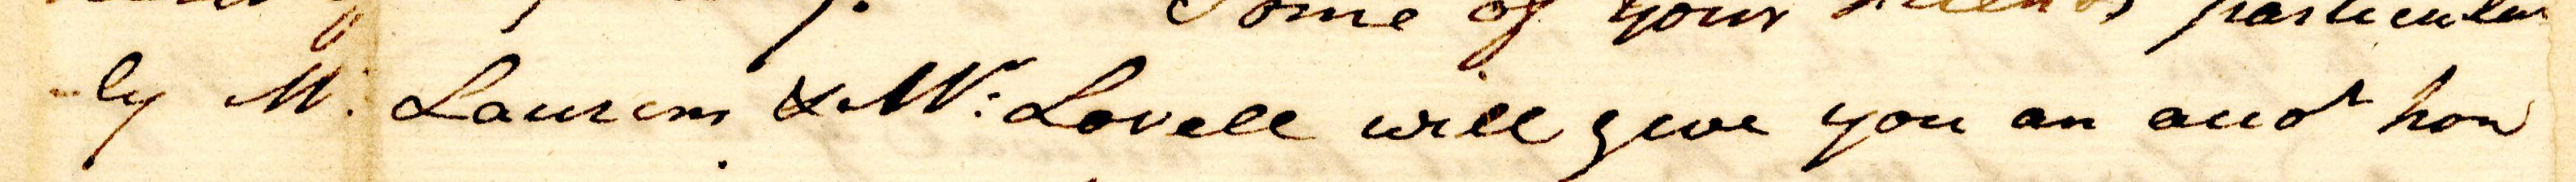-ly M. Laurens & M^r Lovell will give you an acco^t how
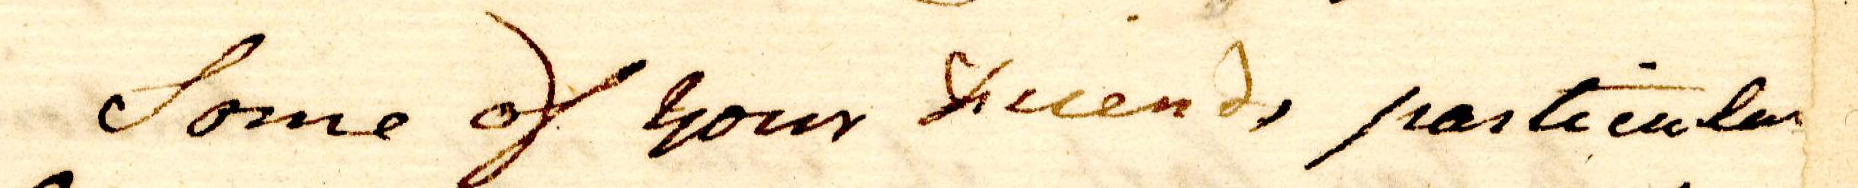Some of Your Friends particular
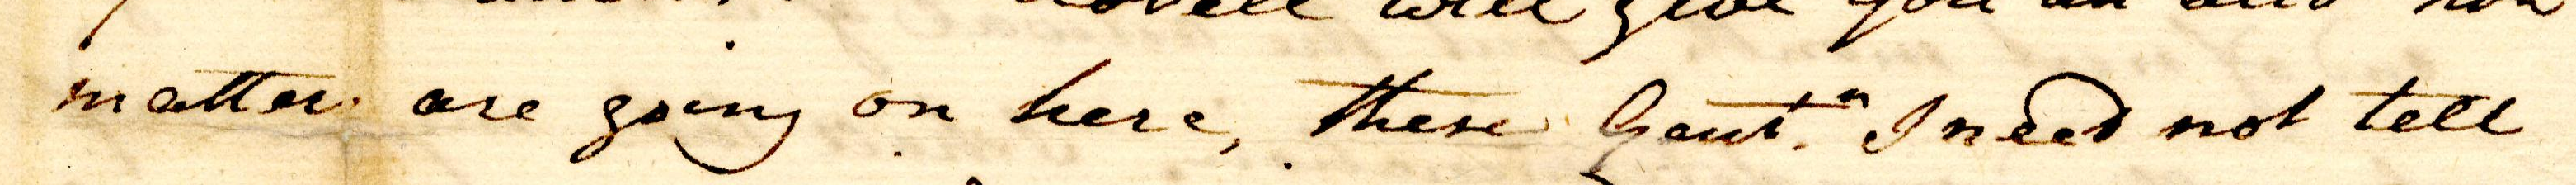matters are going on here, these Gent^n I need not tell
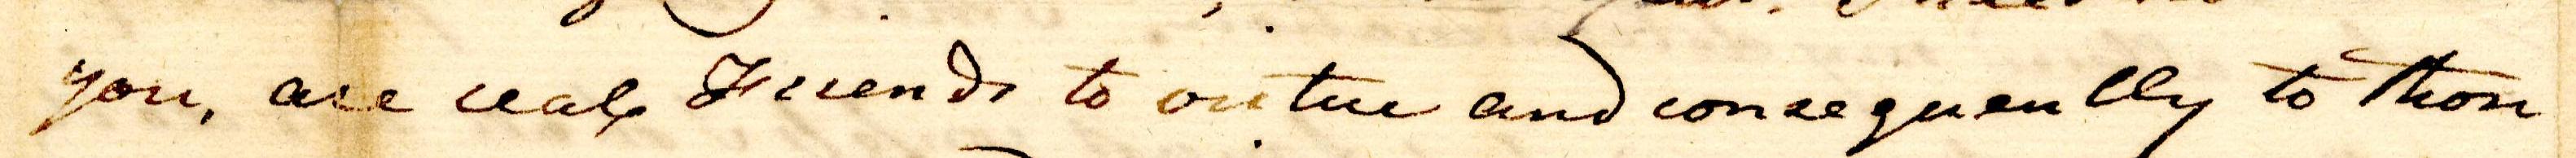you, are real Friends to virtue and consequently to them
